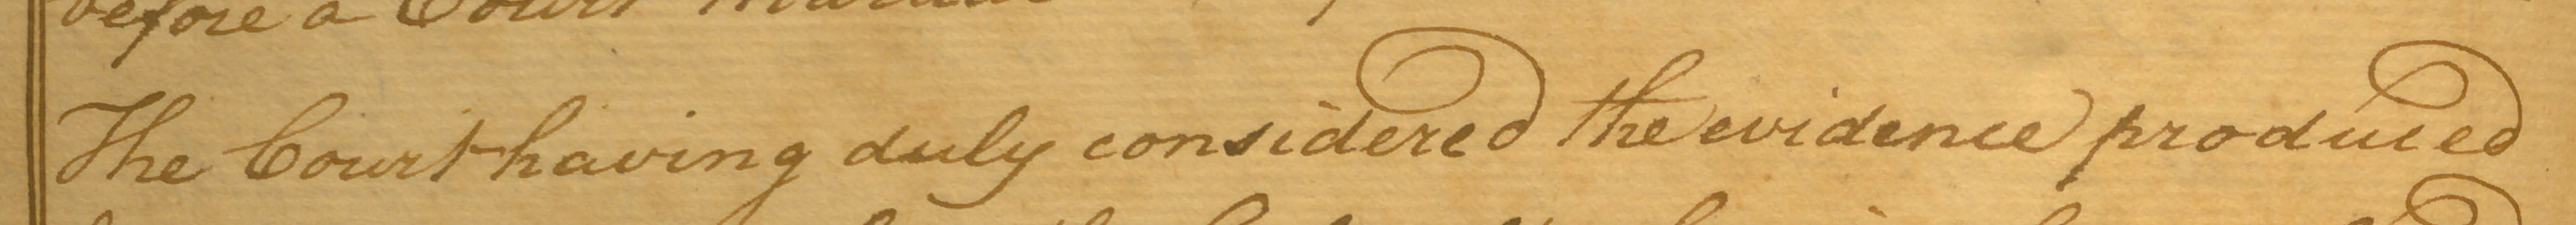The Court having duly considered the evidence produced
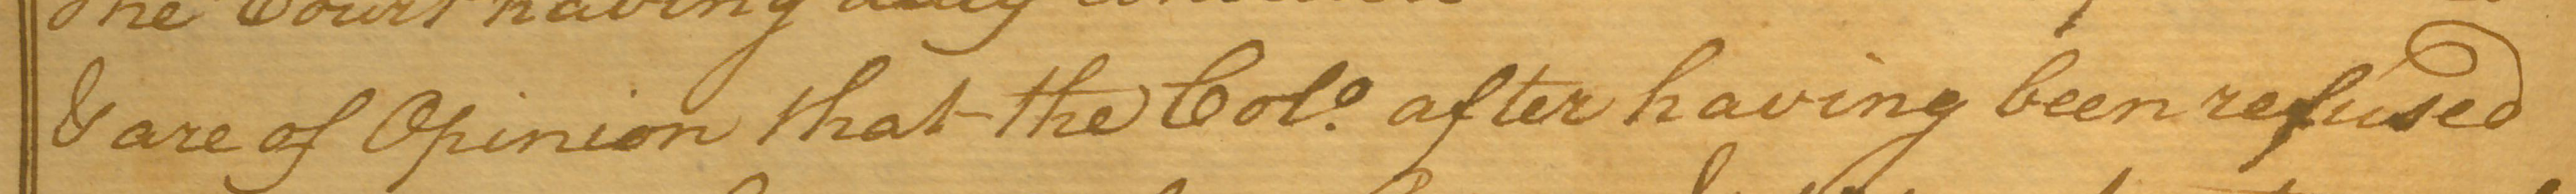& are of Opinion that the Col^o. after having been refused
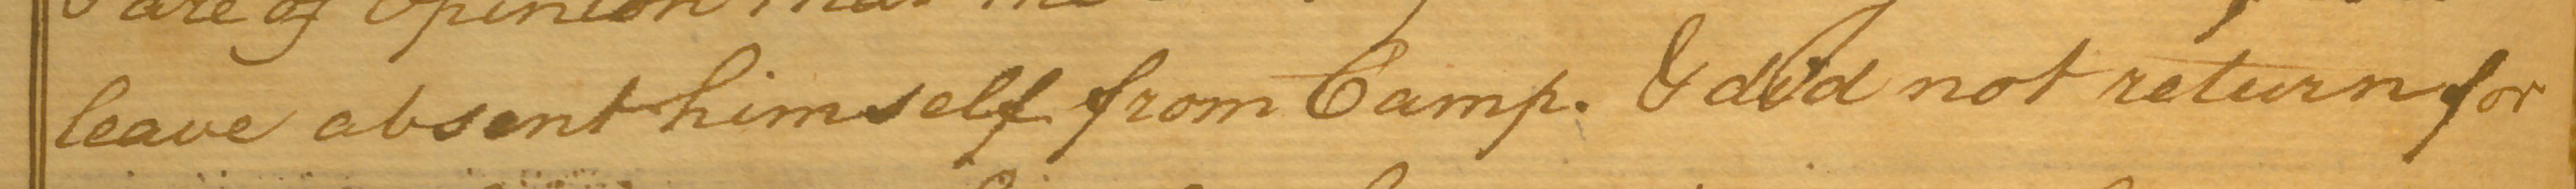leave absent himself from Camp. & did not return for
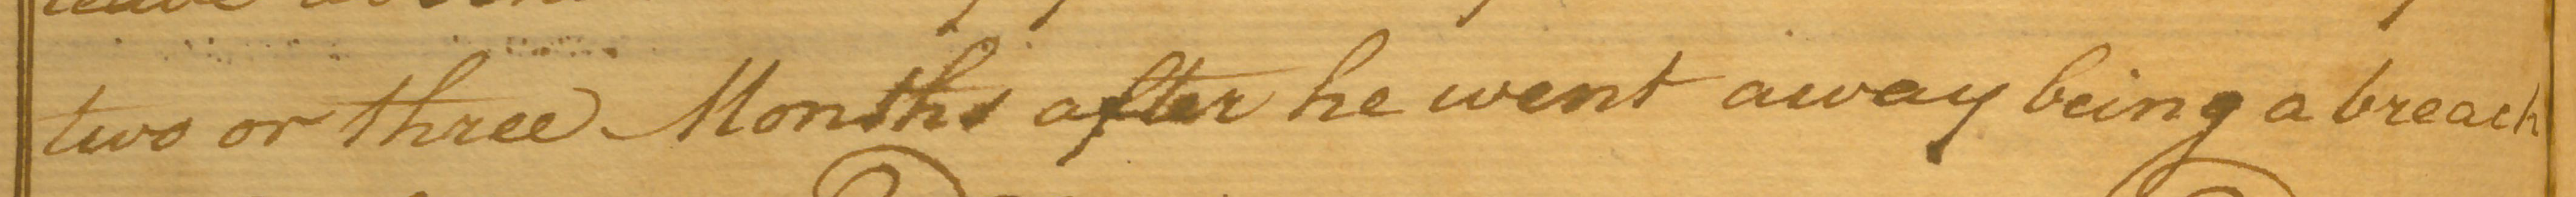two or three Months after he went away being a breach
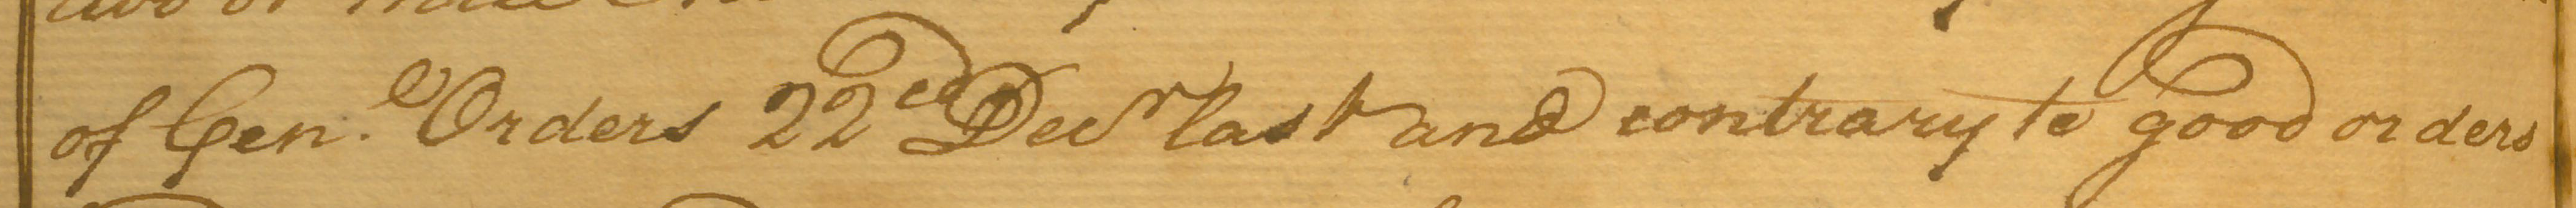of Gen^l. Orders 22^nd Dec^r last and contrary to good orders
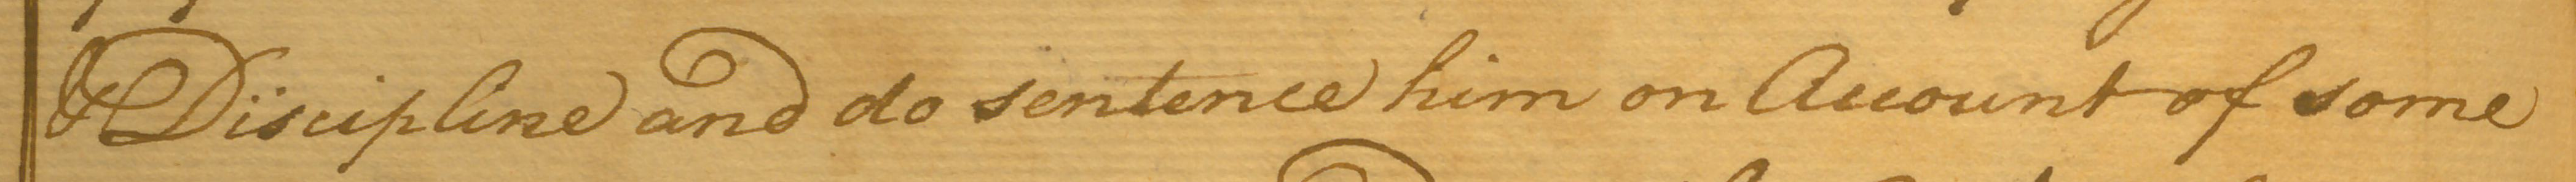& Discipline and do sentence him on Account of some
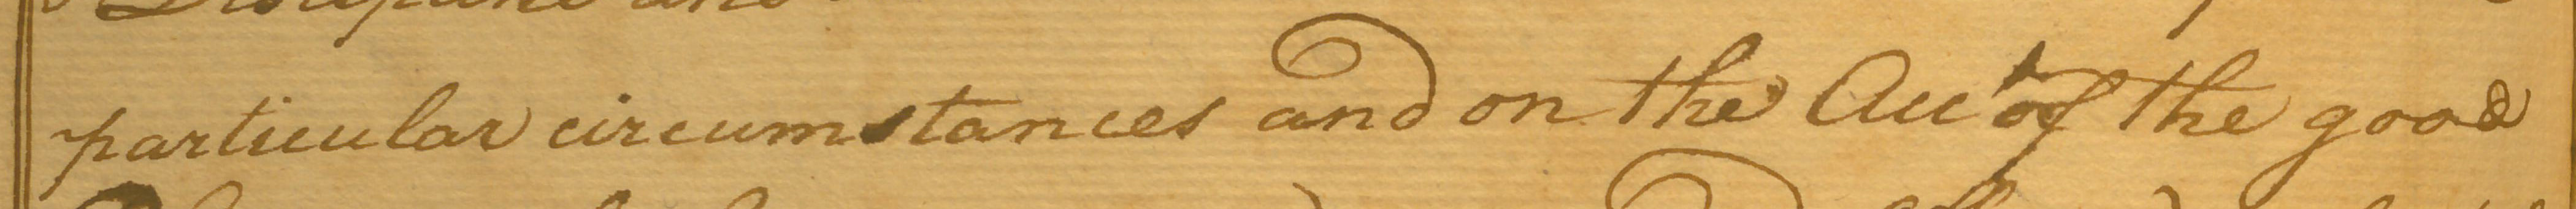particular circumstances and on the Acc^t. of the good
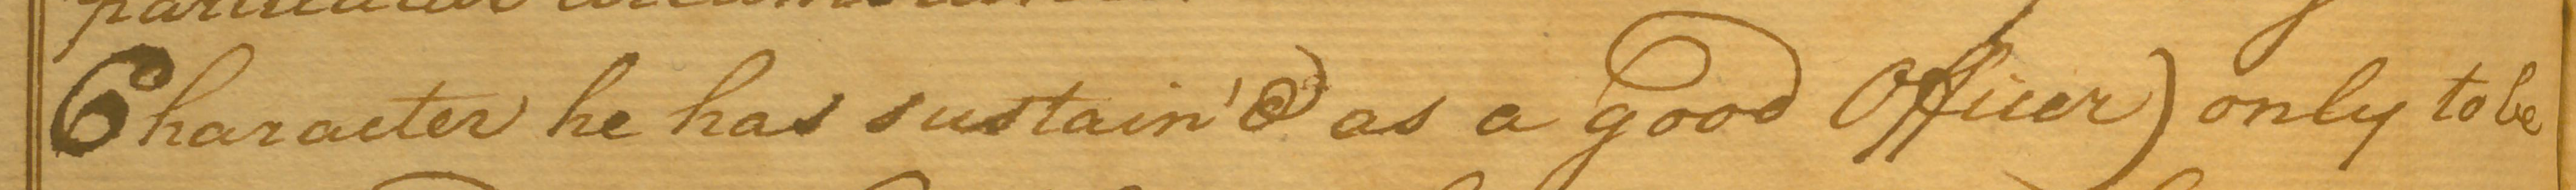Character he has sustain'd as a good Officer) only to be
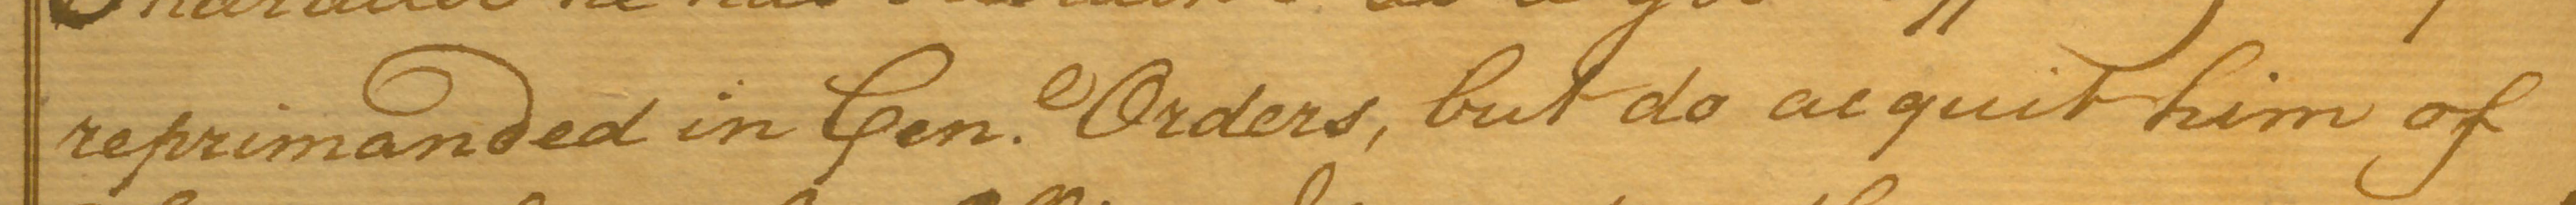reprimanded in Gen^l. Orders, but do acquit him of
